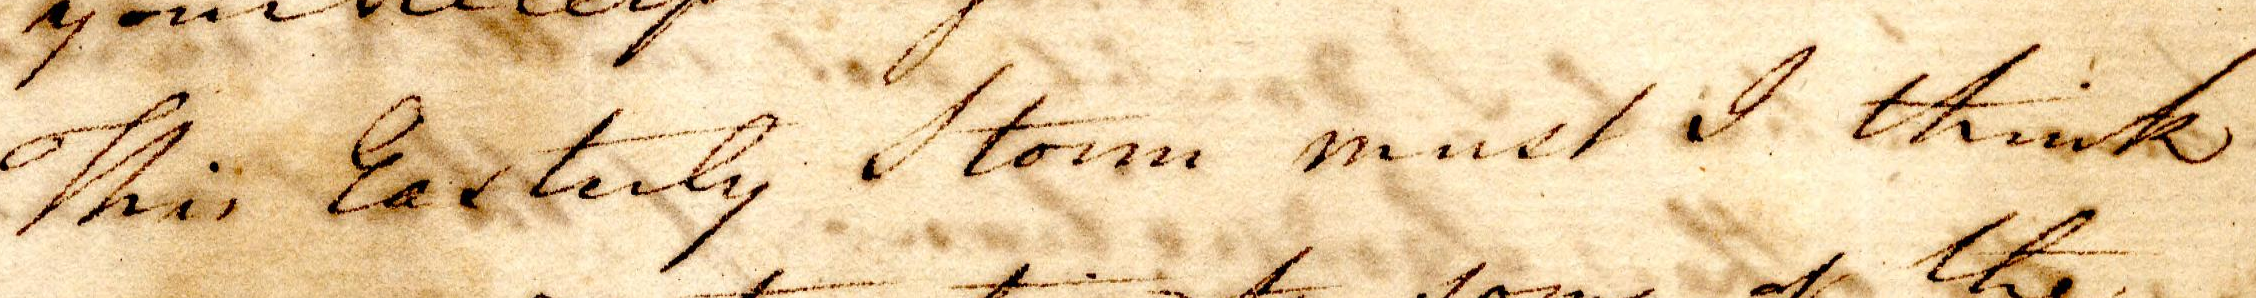This Easterly Storm must I think
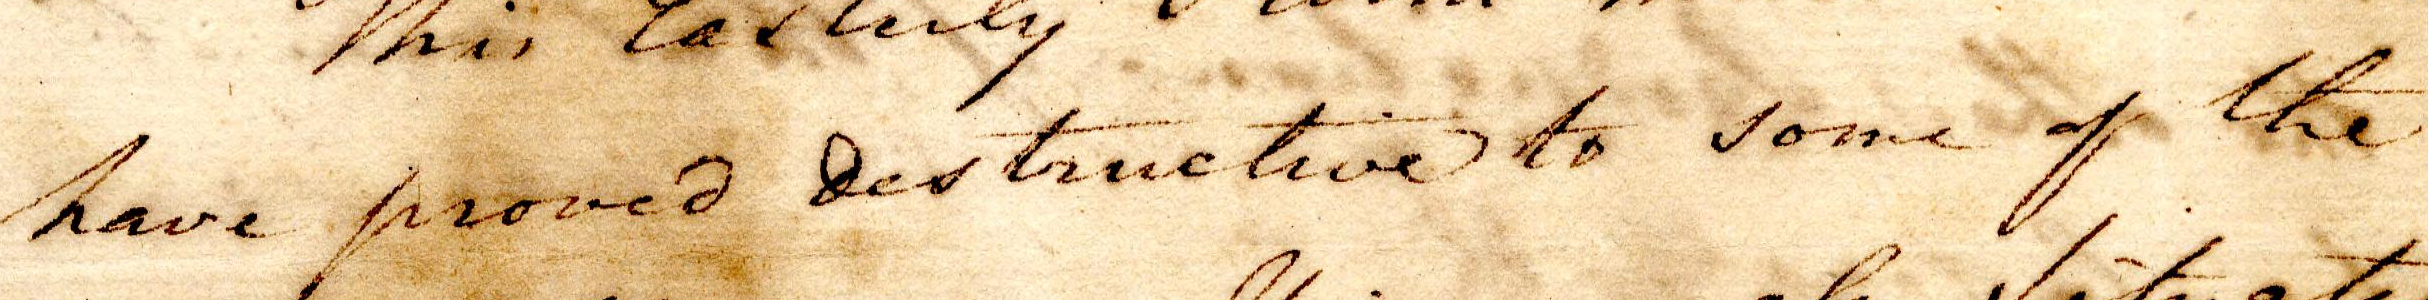have proved destructive to some of the
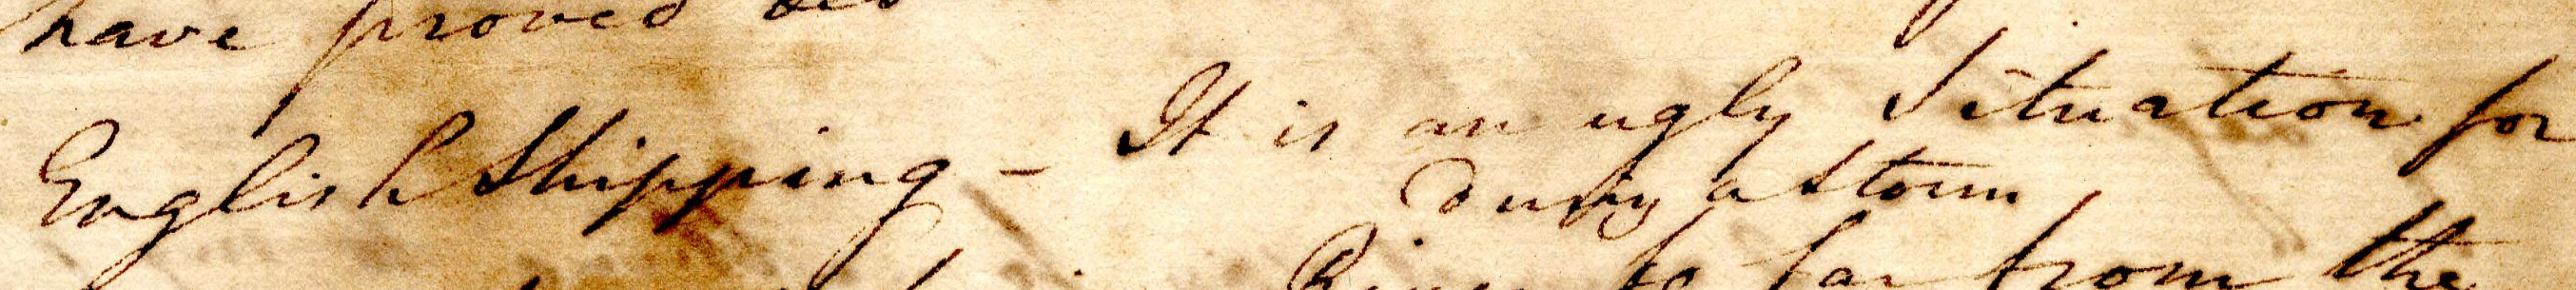English Shipping- It is an ugly Situation for
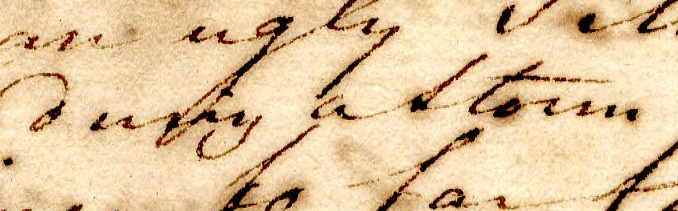during a Storm
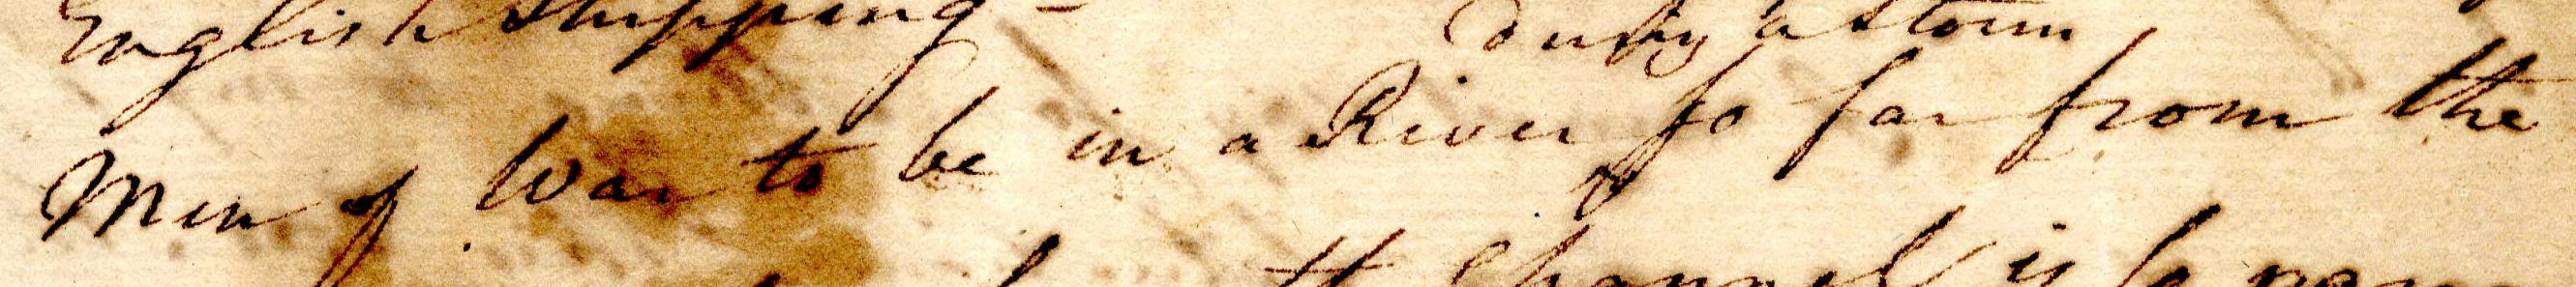Men of War to be in a River ^ so far from the
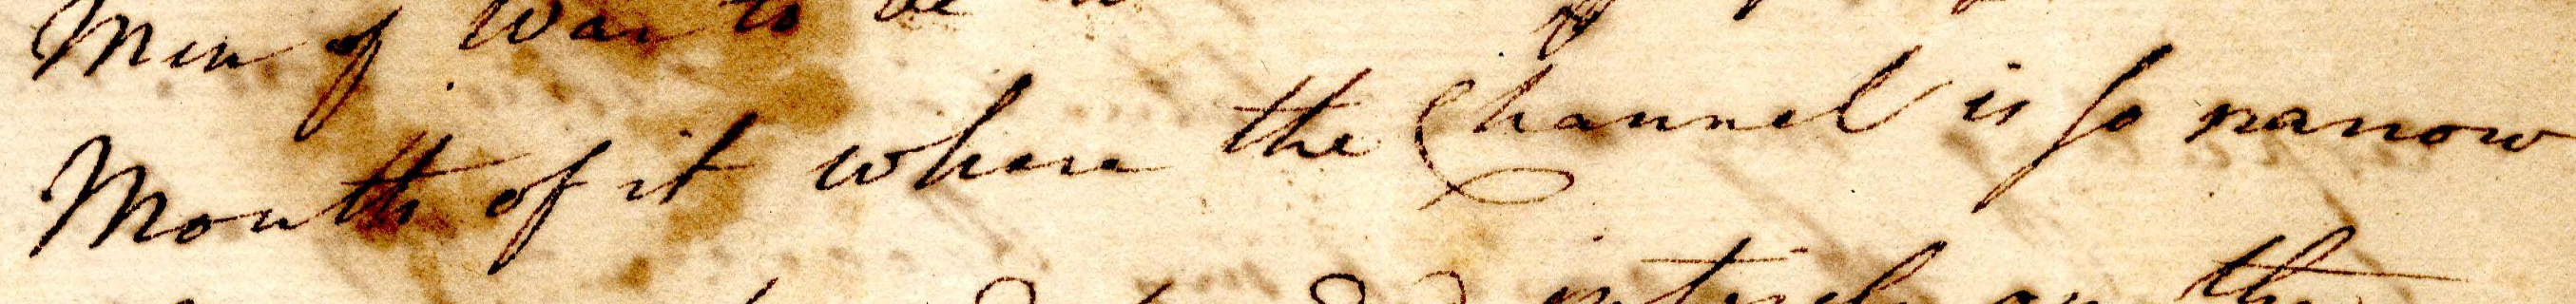Mouth of it where the Channel is so narrow
